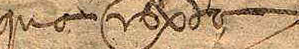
qua esp̄ta
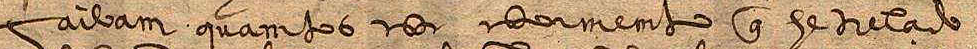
Saibam quamtos este estormemto q̄ he trelado
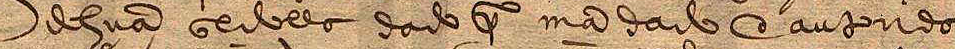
de huā sedolla dado p̄o mādado e autorida
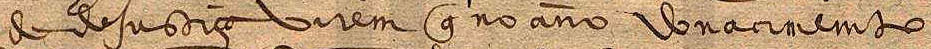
de de Justiça virem q̄ no āno do nacimemto
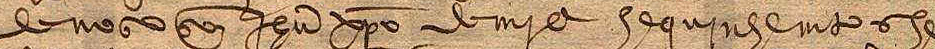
de nosso s̄or Jhū xp̄o de mjll he qujnhemtos he
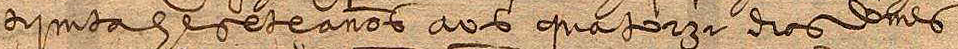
trjmta he sete an̄os aos quatorze dias do mes
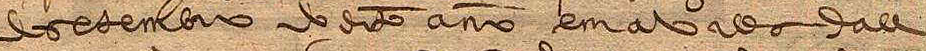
de setembro do dito an̄o em a villa dall
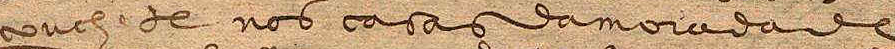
couchete nas casas da morada de
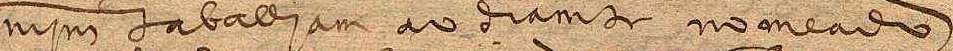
mjm taballjam ao diamte nomeado
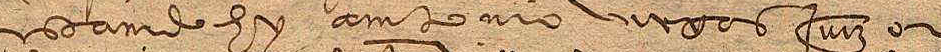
estamdo hy amtonio viegas Juiz or
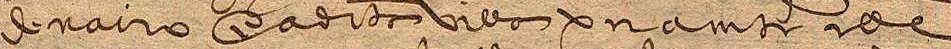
denairo ē a dita villa peramte elle
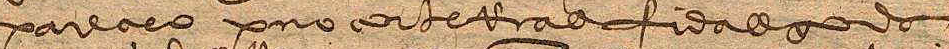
pareçeo pero corte Reall fidalgo da
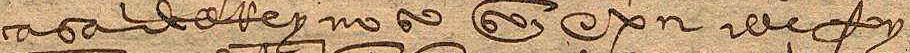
casa dell Rey noso s̄or e per elle foy
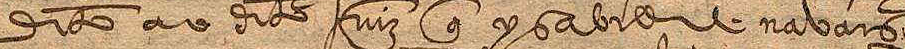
dito ao dito Juiz q̄ ysabell de navaes
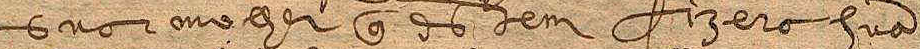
sua molher q̄ d̄s tem fizera huā
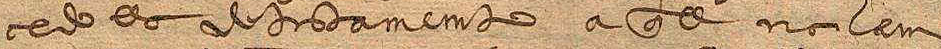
cedolla de testamemto a q̄ll era em
